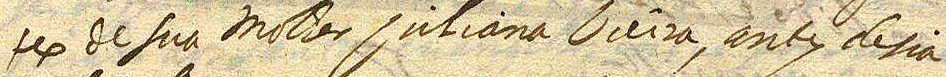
tes de sua molher juliana Vieira, antes desia
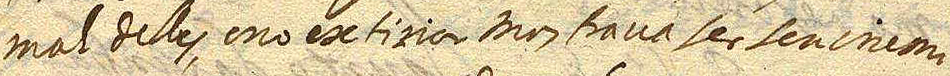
mal delles, e no extirior mostraua ser seu inemi
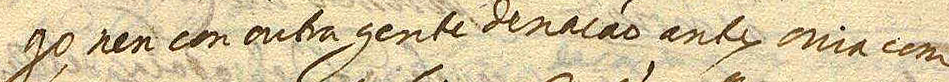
go, nem con outra gente de nacaõ antes o uia com
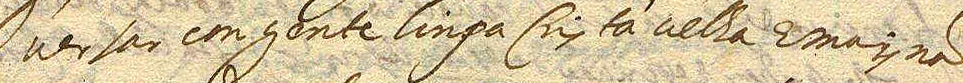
uersar con gente linpa Cristã uelha E mais naõ
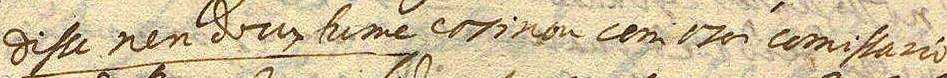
disse nen do custume e asinou com o sor̄ comissario
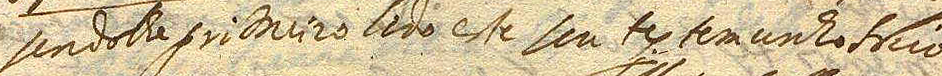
sendolhe primeiro lido este seu testemunho Nico
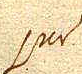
jur
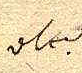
vlta.
